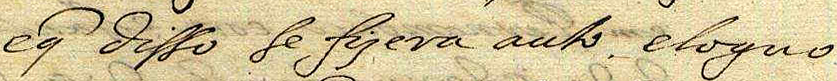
e q̄ disso se fizera auto, e loguo
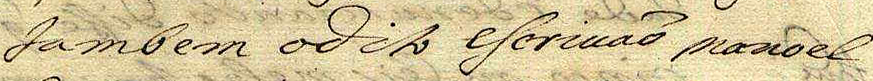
tambem o dito escriuaõ Manoel
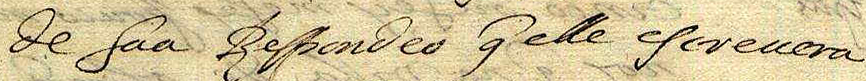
de saa Respondeo q̄ elle escreuera
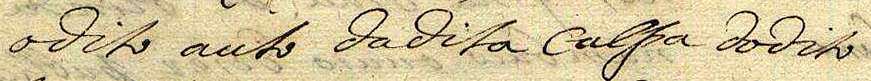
o dito auto da dita culpa do dito
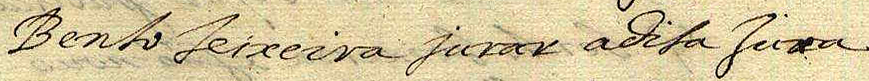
Bento teixeira jurar a dita Jura
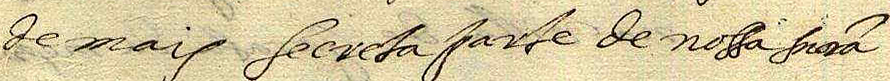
de mais secreta parte de nossa senorā
